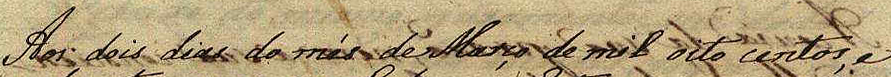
Aos dois dias do més de Março de mil oito centos, e
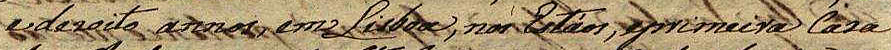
e dezoito annos, em Lisboa, nos Estáos, e primeira Caza
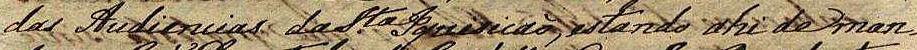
das Audiencias da S.ta Iquisiçaõ, estando ahi de man
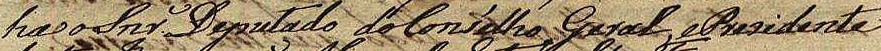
ha o Snr̄ Deputado do Conselho Geral, e Prezidentes
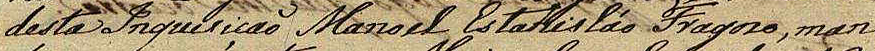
desta Inquisiçaõ Manoel Estanisláo Fragozo, man
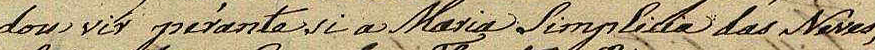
dou vir perante si a Maria Simplicia das Neves,
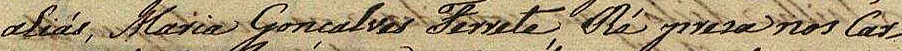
aliás, Maria Gonçalves Ferrete, Ré preza nos Car
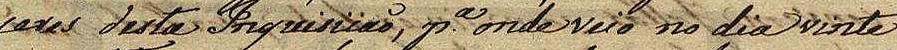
ceres desta Inquisiçaõ, p.a onde veio no dia vinte
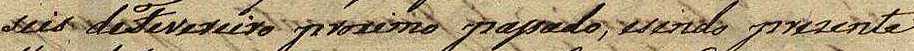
seis de Fevereiro proximo passado, e sendo prezente
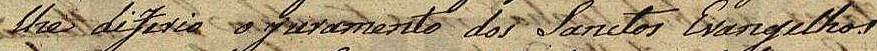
lhe diferio o juramento dos Sactos Evangelhos
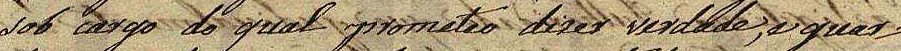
sob cargo do qual prometeo dizer verdade, e guar
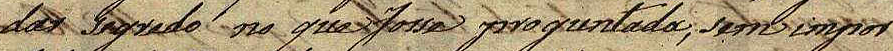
dar segredo no que fosse proguntada, sem impor
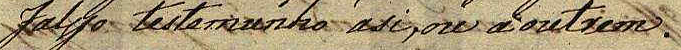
falso testemunho a si, ou a outrem.
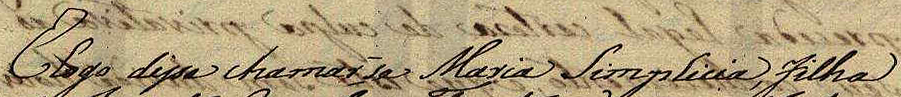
E logo disse chamar-se Maria Simplicia, filha
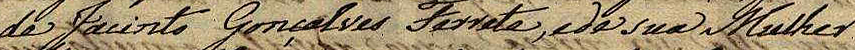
de Jacinto Gonçalves Ferrete, e de sua Mulher
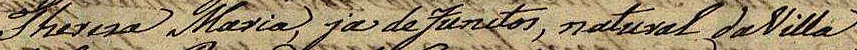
Thereza Maria, ja defunctos, natural da Villa
